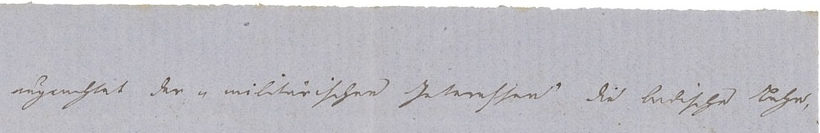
der «militärischen
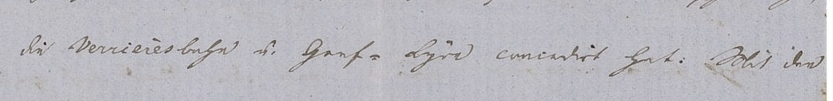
die Verrièresbahn u. Genf–Lyon concedirt hat. Mit den
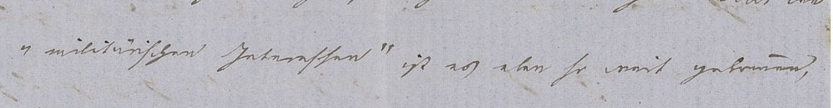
«militärischen Interessen» ist es eben so weit gekommen,
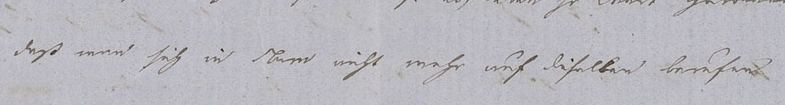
daß man sich in Bern nicht mehr auf dieselben berufen
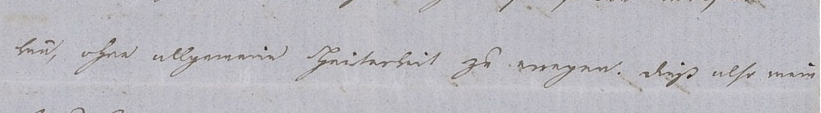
kann, ohne allgemeine Heiterkeit zu erregen. Dieß also mein
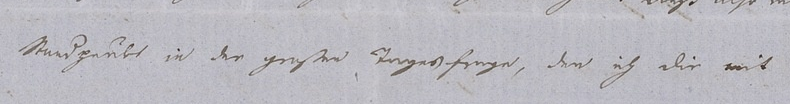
Standpunkt in der großen Tagesfrage, den ich Dir mit
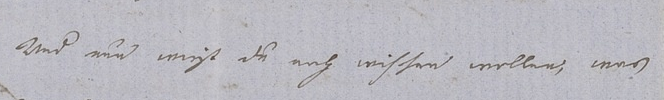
Und nun wirst du noch wissen wollen, was
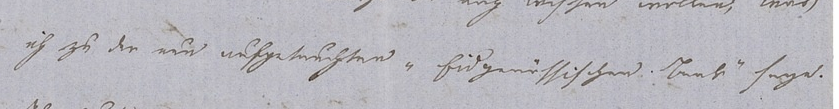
ich zu der neu aufgetauchten «Eidgenössischen Bank» sage.
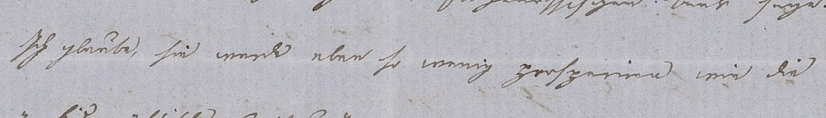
Ich glaube, sie werde eben so wenig prosperiren wie die
